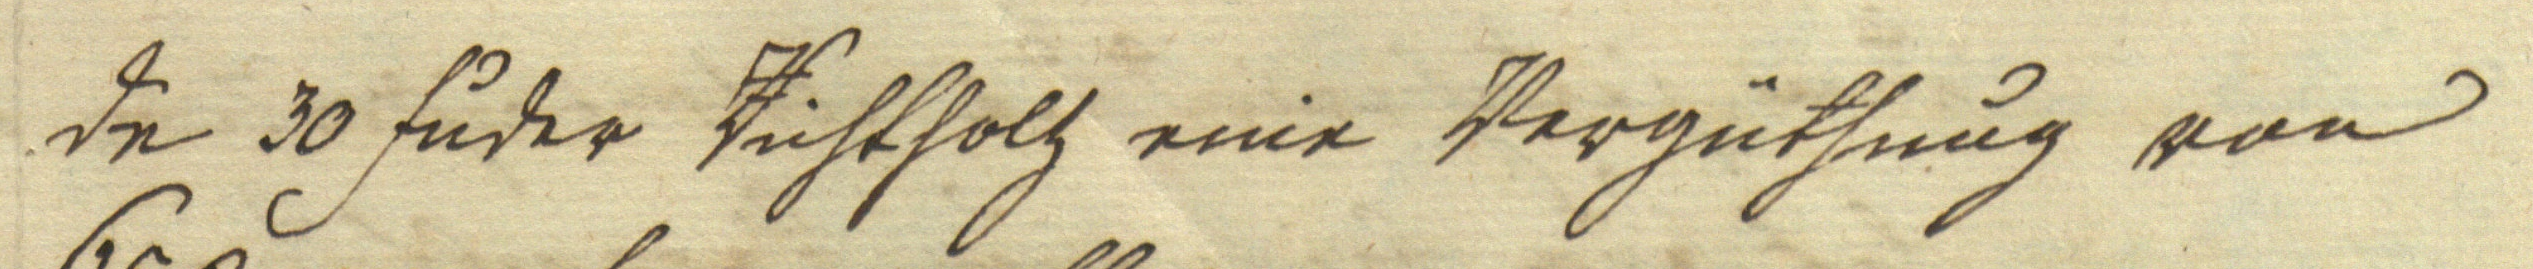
de 30 Fuder Richtholz eine Vergüthung von
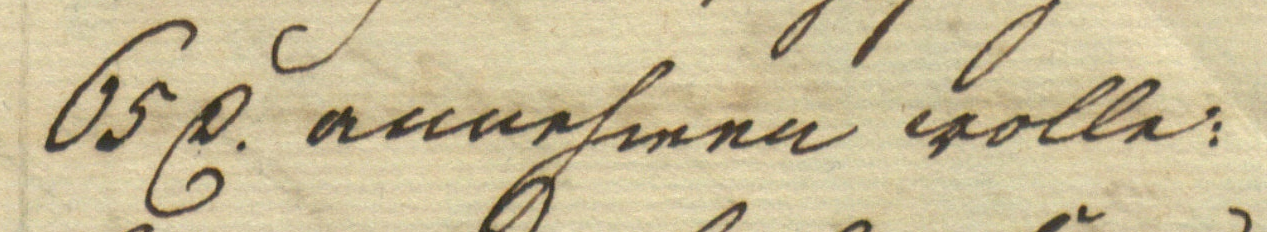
65 l. annehmen wolle.
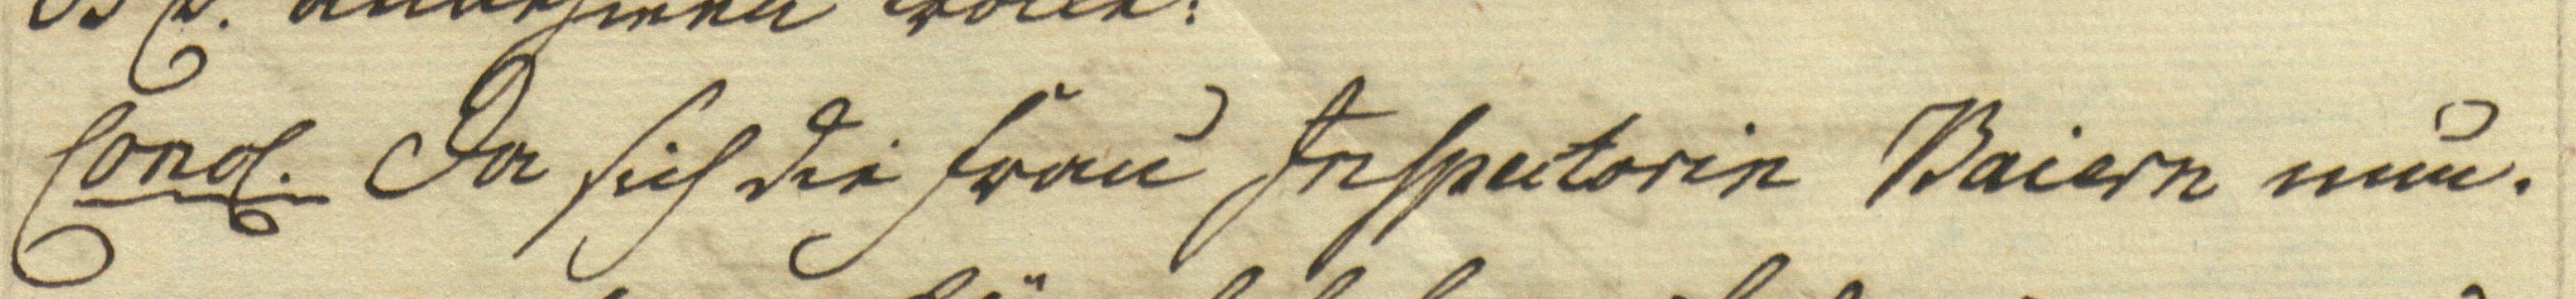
Concl. Da sich die Frau Inspectorin Baiern nun¬
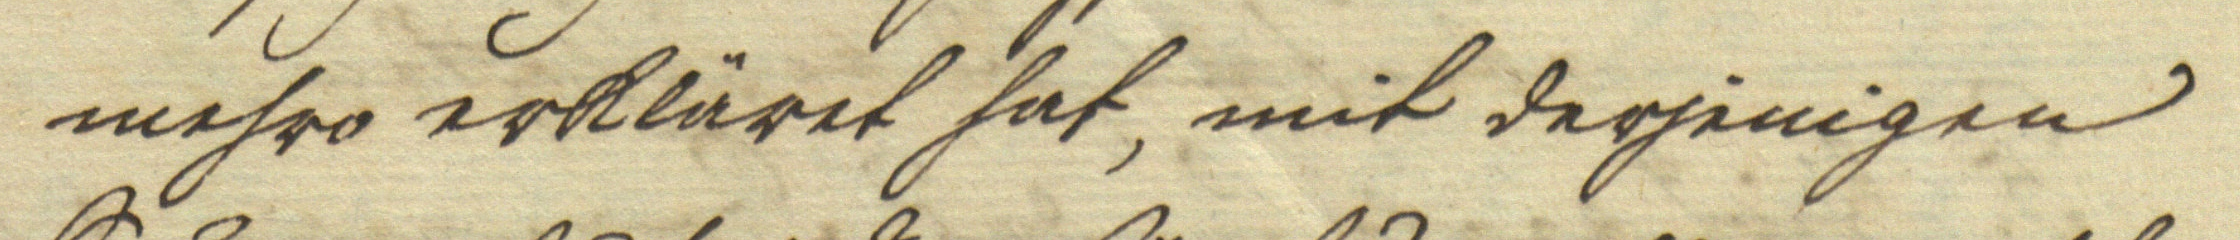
mehro erkläret hat, mit derjenigen
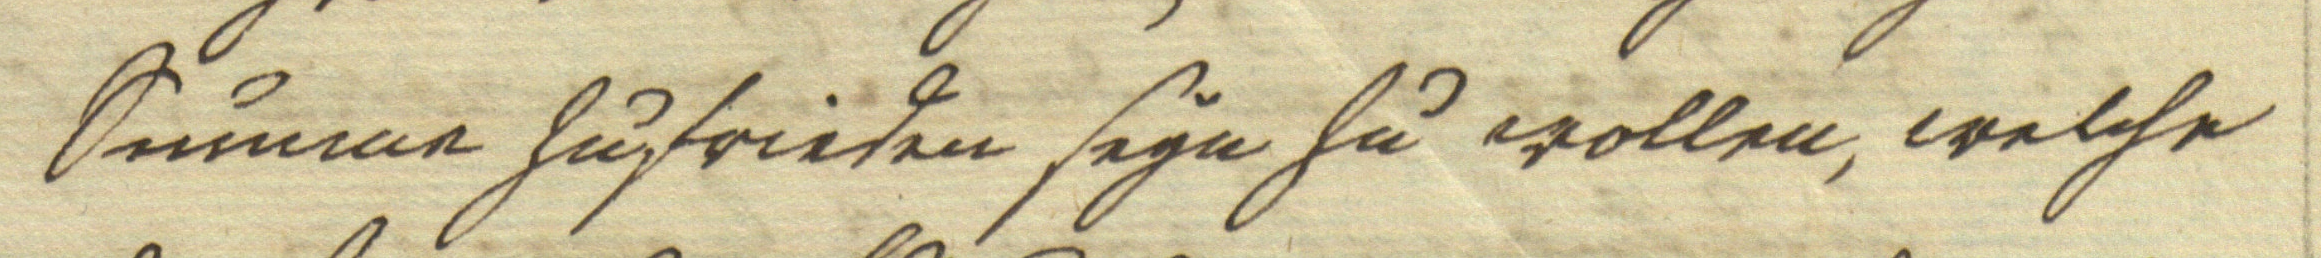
Summe zufrieden seÿn zu wollen, welche
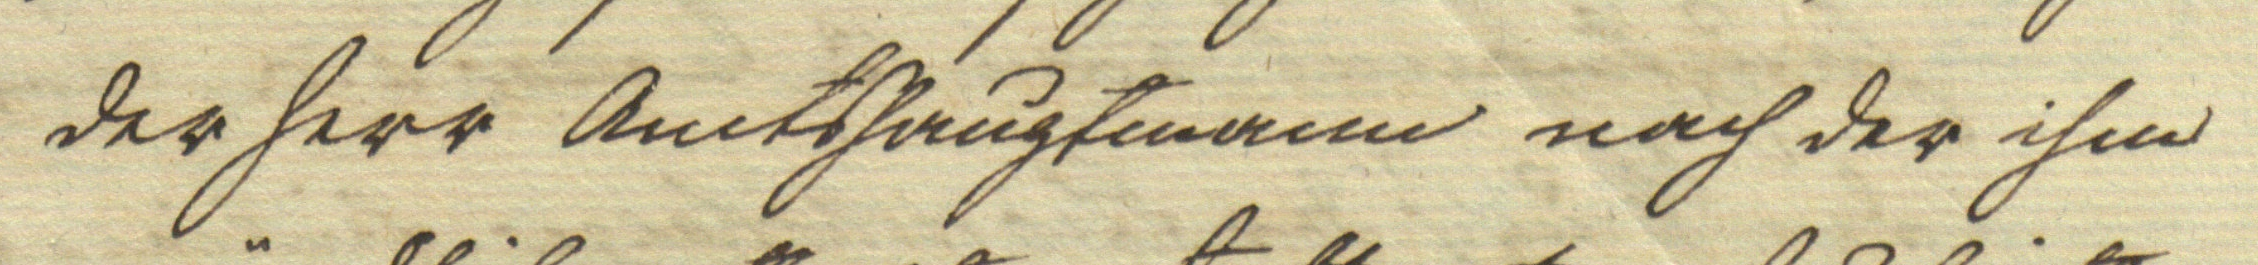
der Herr Amtshauptmann nach der ihm
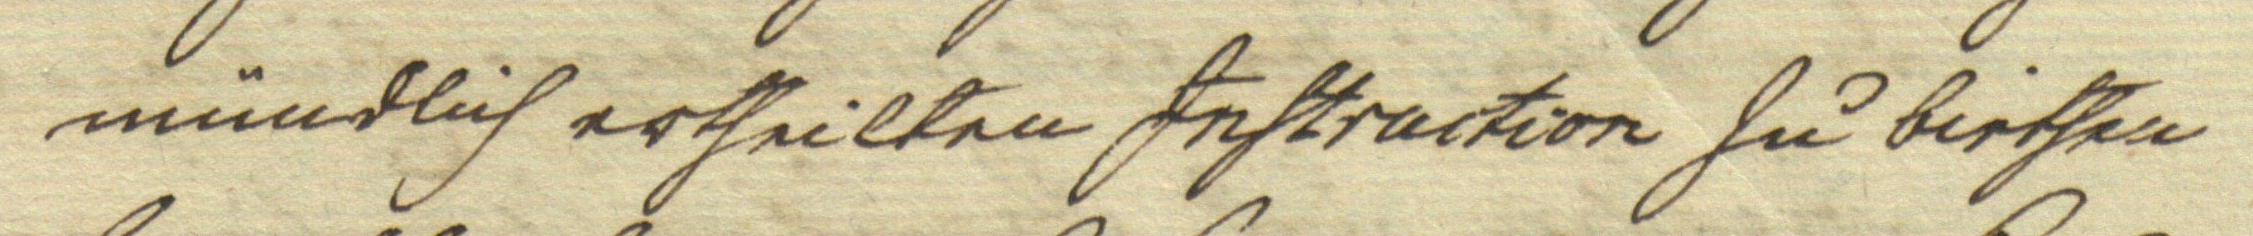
mündlich ertheilten Instruction zu biethen
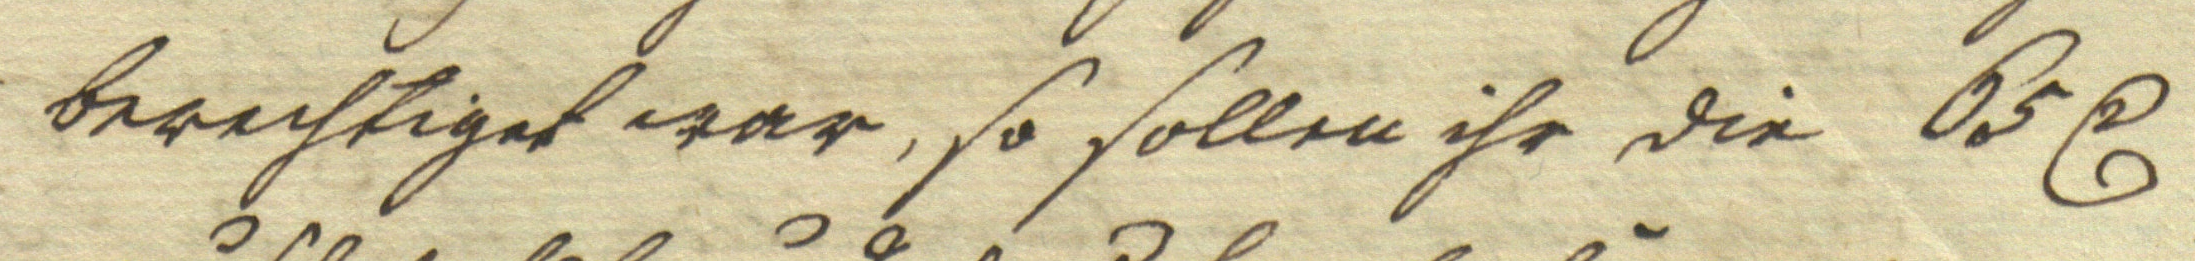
berechtiget war, so sollen ihr die 65 l.
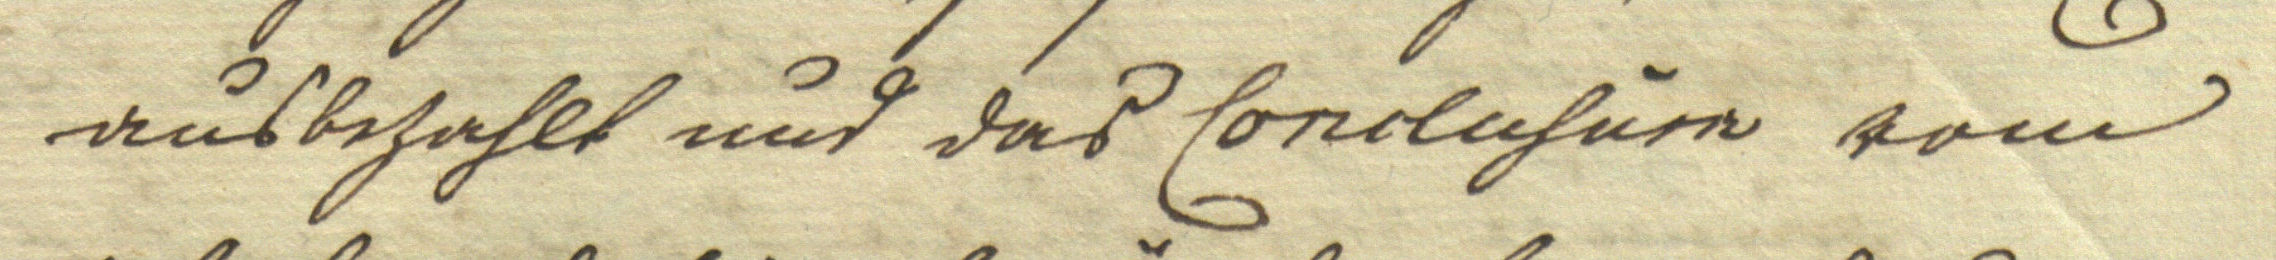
ausbezahlt und das Conclusum vom
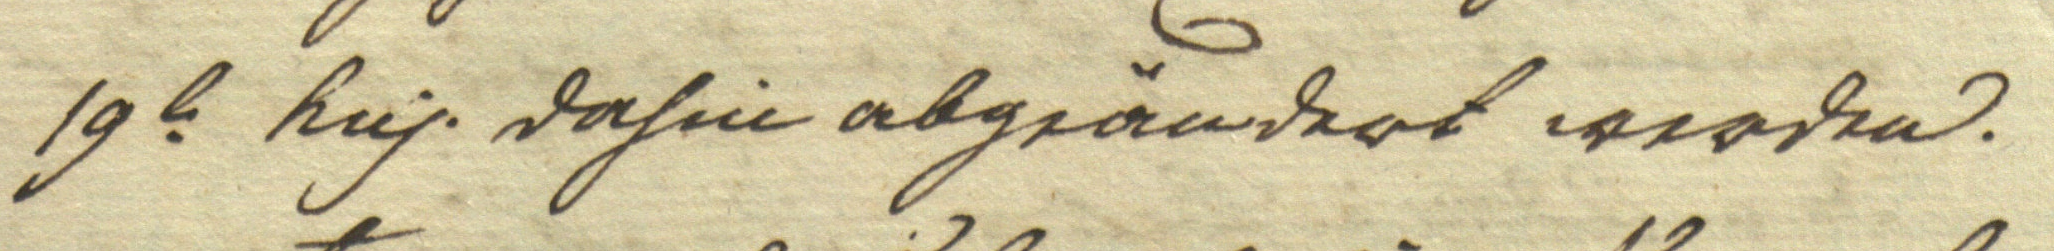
19 t. huj. dahin abgeändert werden.
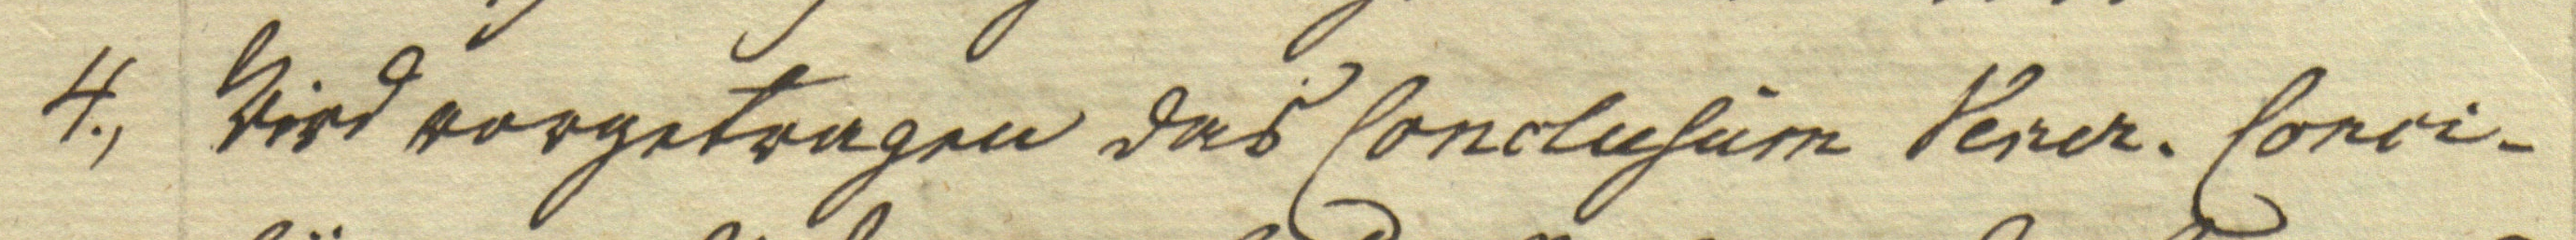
4. Wird vorgetragen das Conclusum Vener. Conci¬
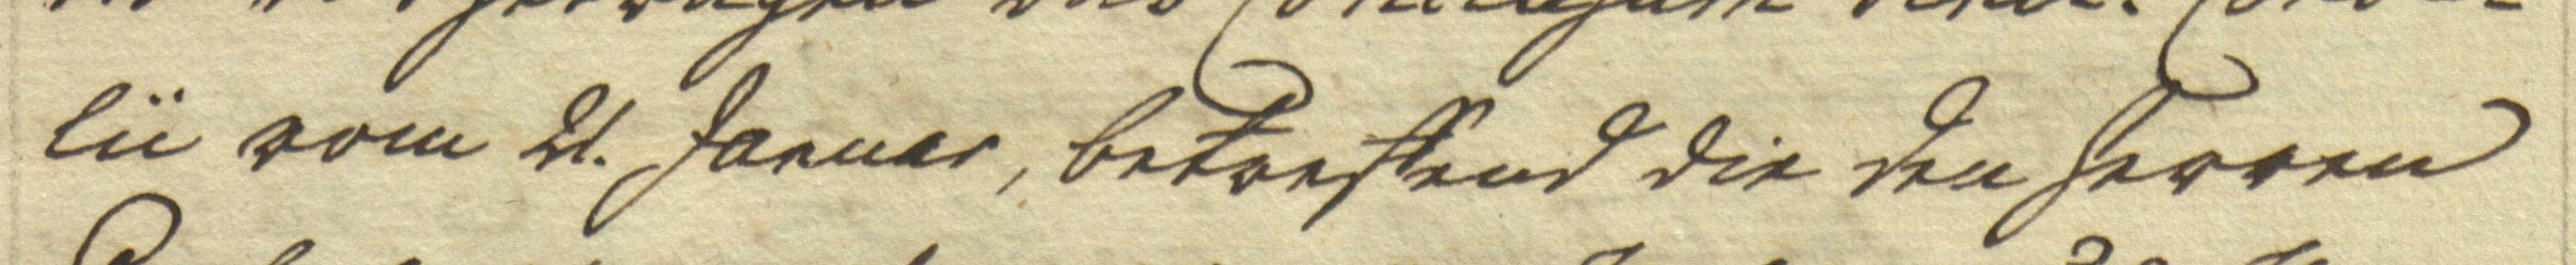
lii vom 21. Januar, betreffend die den Herren
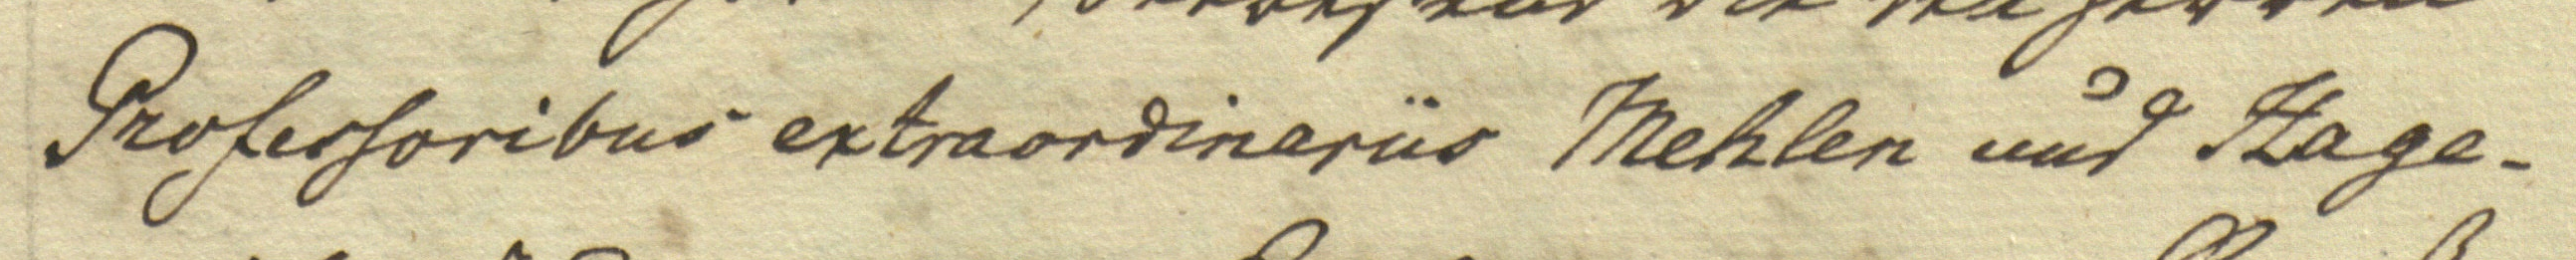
Professoribus extraordinariis Mehlen und Hage¬
